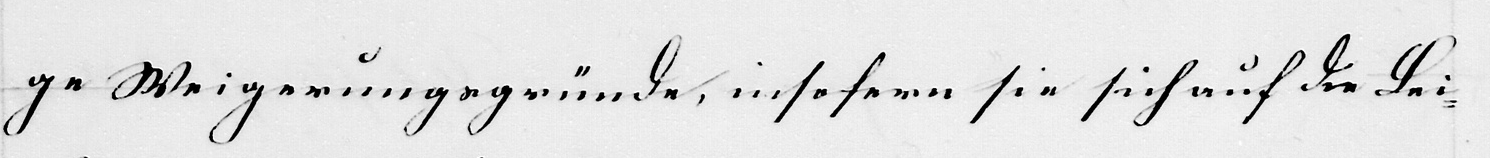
ge Weigerungsgründe, insofern sie sich auf die Leis¬
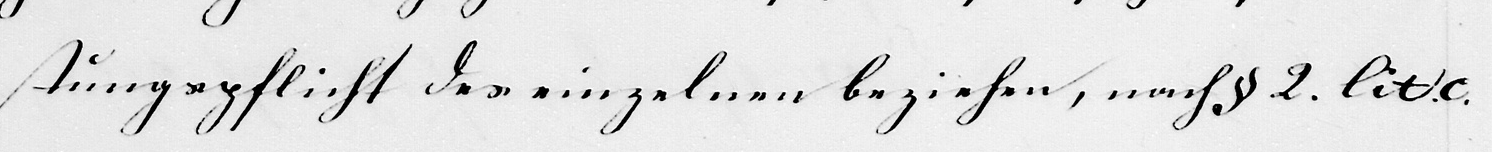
tungspflicht des einzelnen beziehen, nach § 2. lit. c.
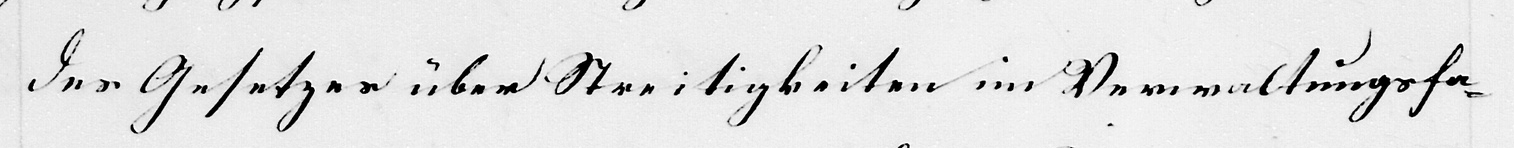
des Gesetzes über Streitigkeiten im Verwaltungsfa¬
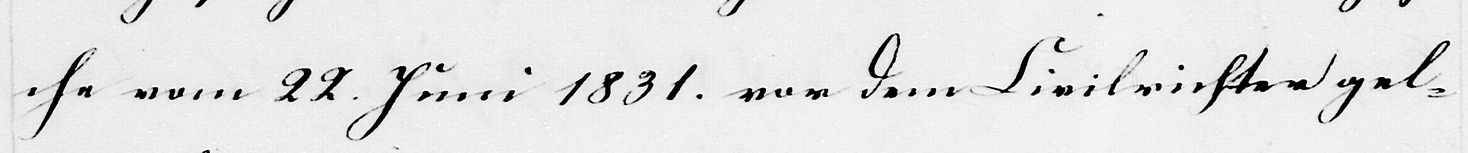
che vom 22. Juni 1831. vor dem Civilrichter gel¬
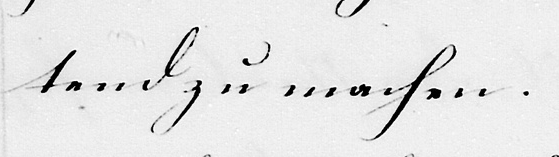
tend zu machen.
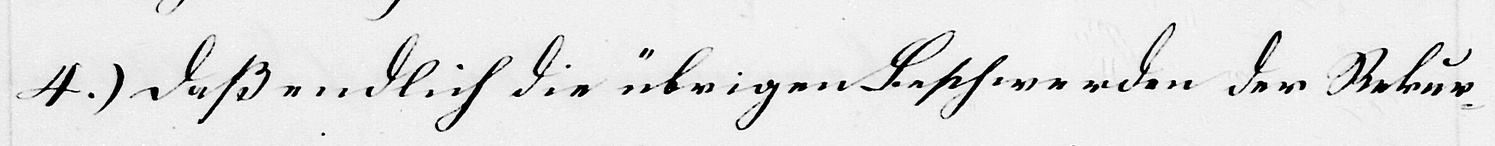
4.) Daß endlich die übrigen Beschwerden der Rekur¬
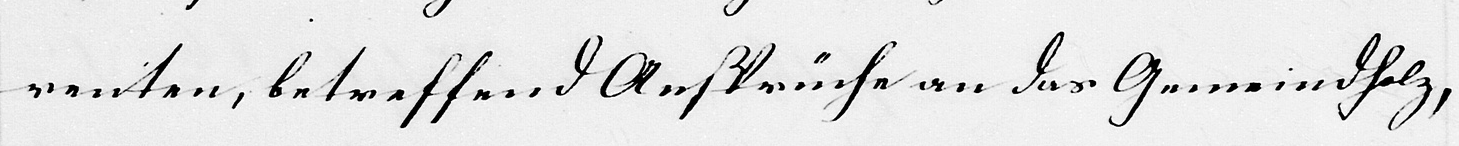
renten, betreffend Ansprüche an das Gemeindholz,
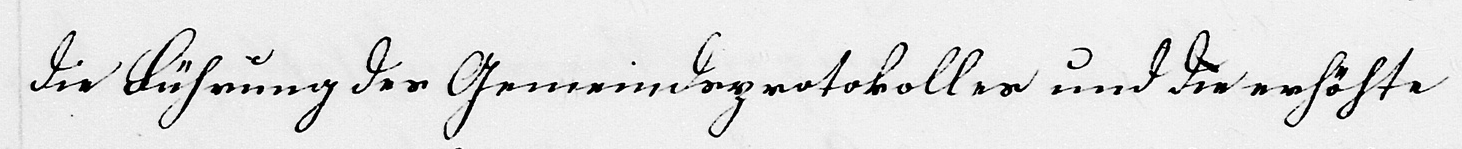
die Führung des Gemeindsprotokolles und die erhöhte
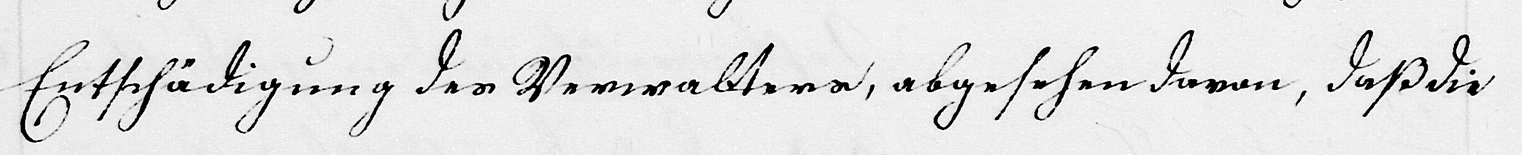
Entschädigung des Verwalters, abgesehen davon, daß die
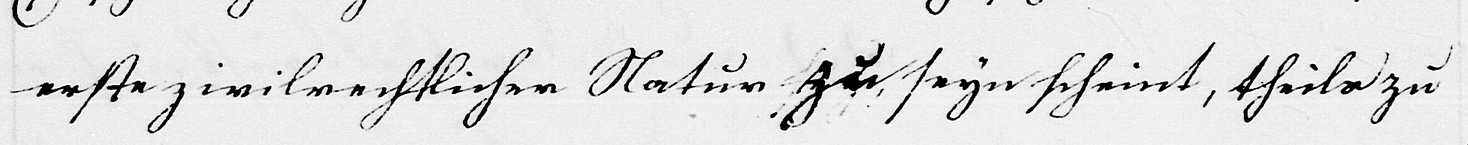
erste zivilrechtlicher Natur zu seyn scheint, theils zu
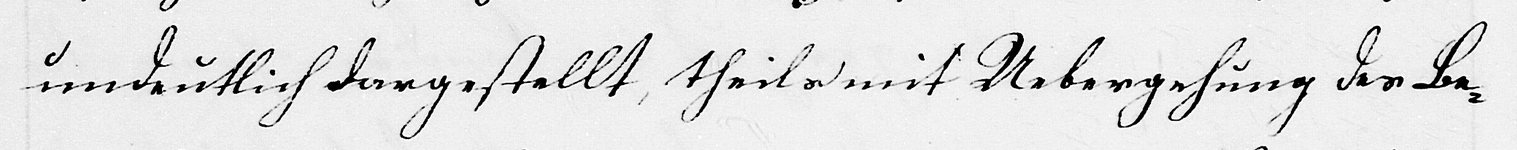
undeutlich dargestellt, theils mit Uebergehung des Be¬
